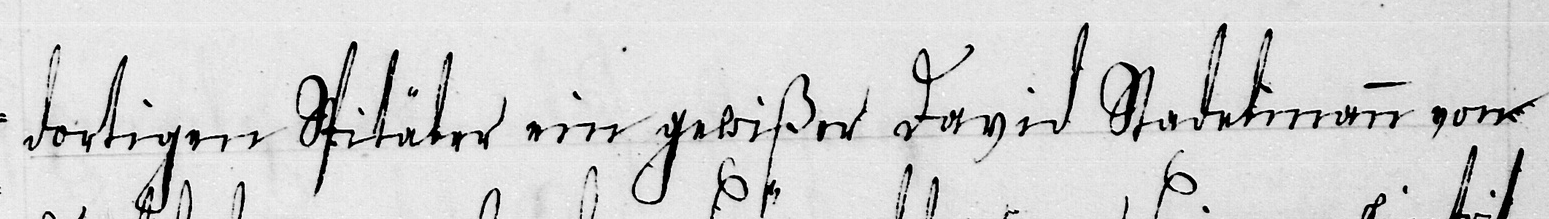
dortigen Spitäler ein gewißer David Stadelmann von
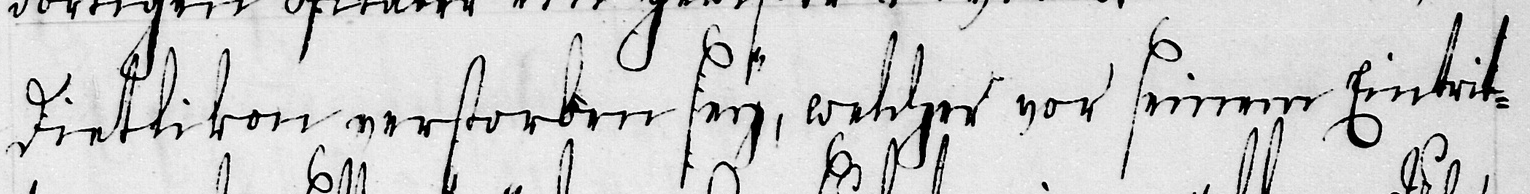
Dietlikon verstorben sey, welcher vor seinem Eintrit¬
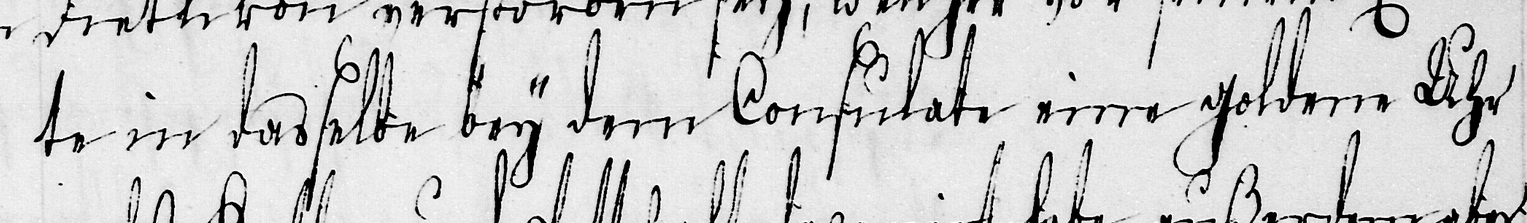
te in dasselbe bey dem Consulate eine goldene Uhr
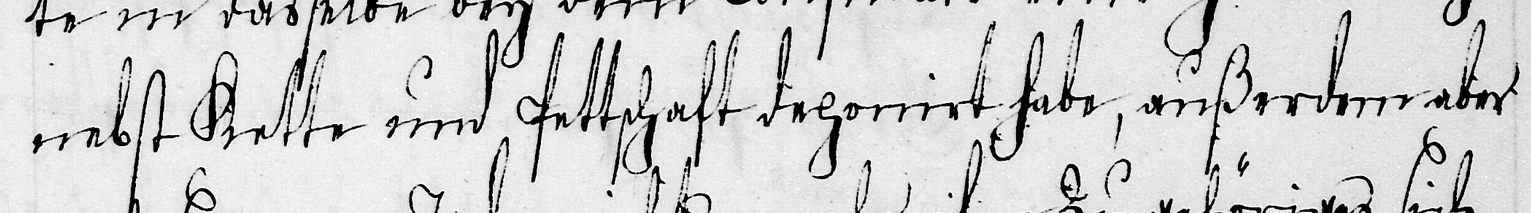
nebst Kette und Pettschaft deponirt habe, außerdem aber
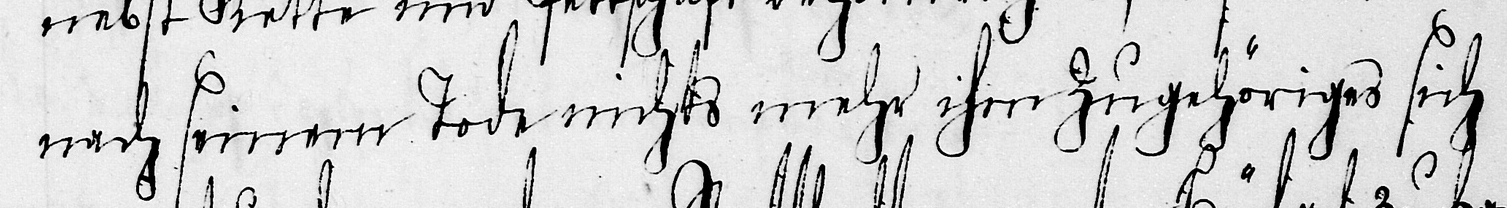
nach seinem Tode nichts mehr ihm Zugehöriges sich
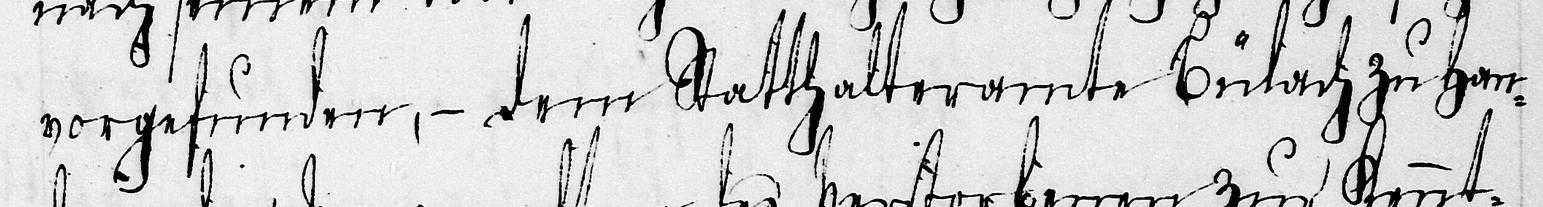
vorgefunden, – dem Statthalteramte Bülach zu Han¬
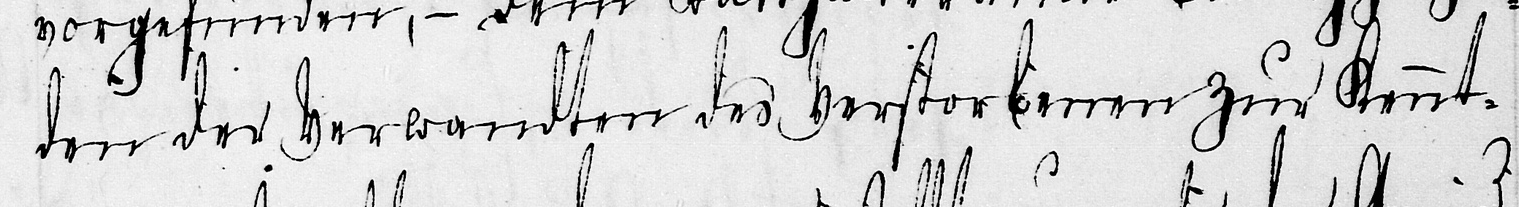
den der Verwandten des Verstorbenen zur Kennt¬
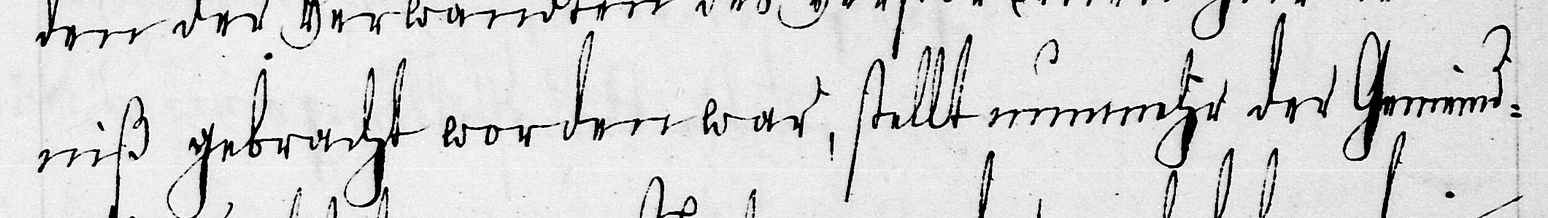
niß gebracht worden war, stellt nunmehr der Gemeind¬
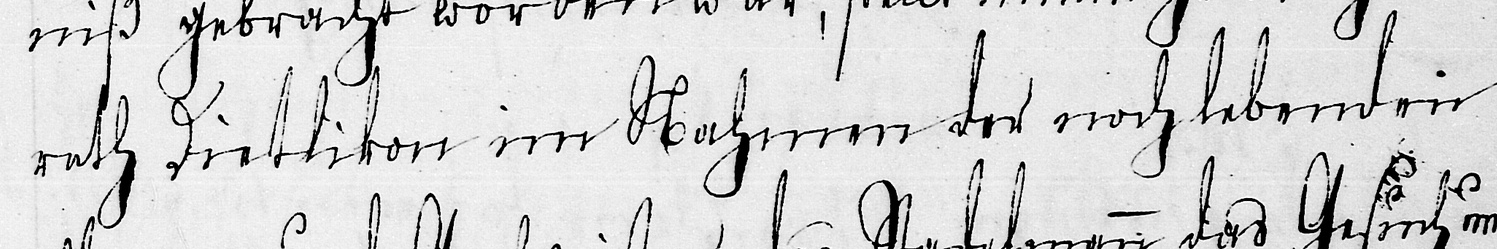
rath Dietlikon im Nahmen der noch lebenden
